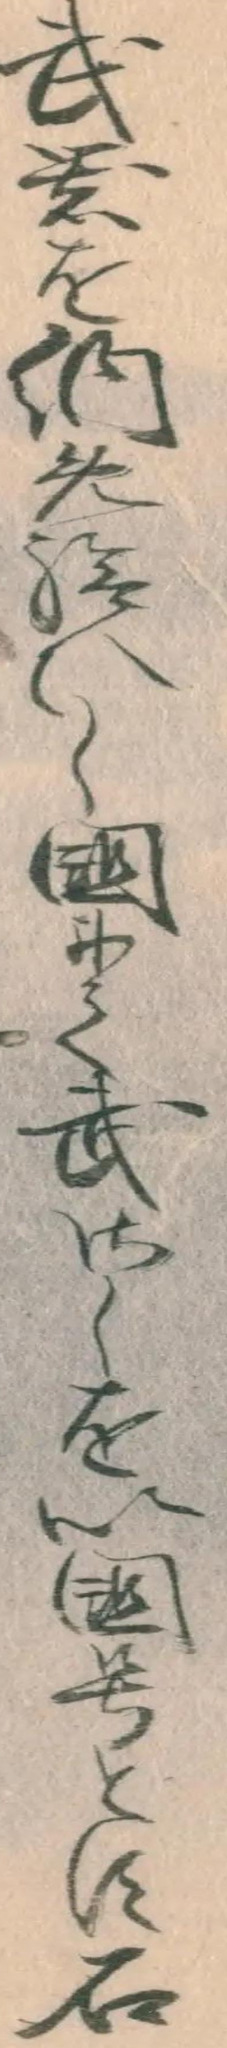武器を納め給ひし国にて武さしを以国号とす石
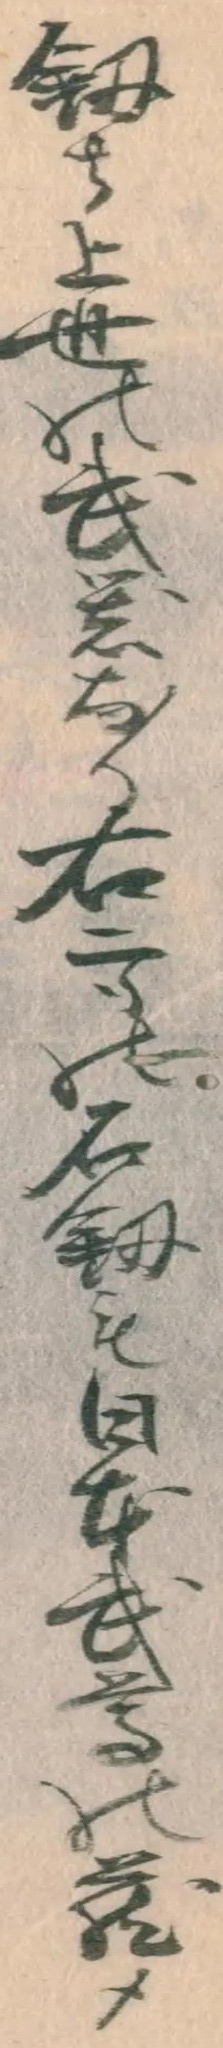剣は上世の武器なり右二つの石剣も日本武尊の蔵〆
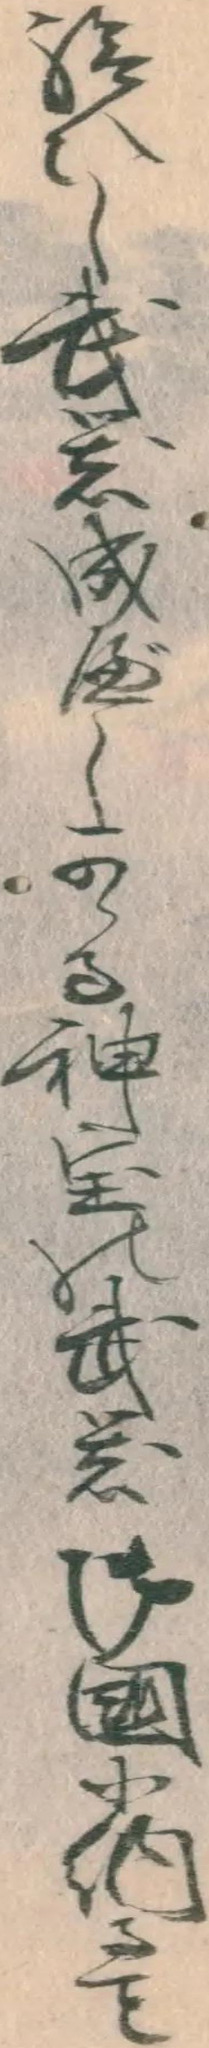給ひし武器成べしかゝる神宝の武器御国に納ること
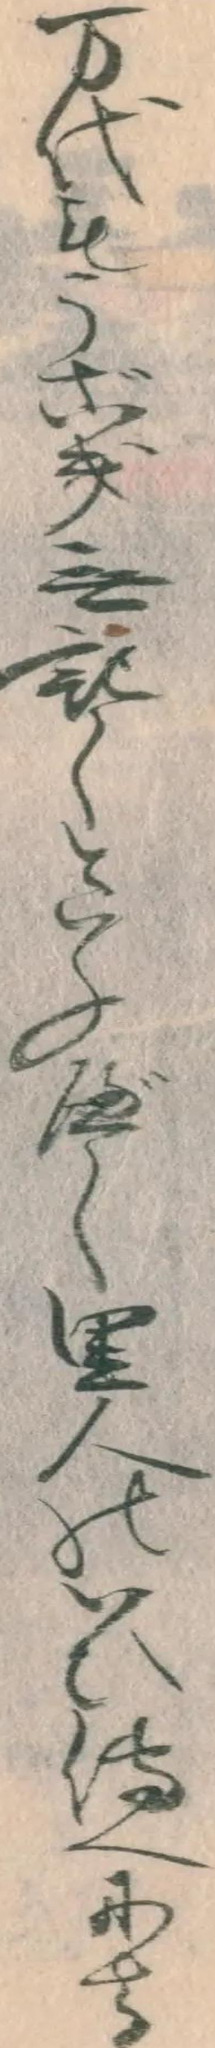万代もうごき無記しといふべし里人のいひ伝へには
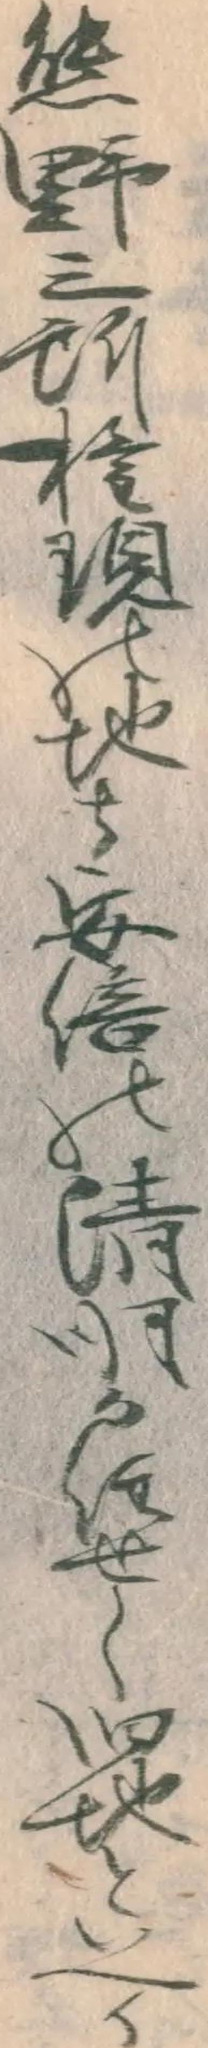熊野三所権現の地は安倍の清明か住せし旧地といへり
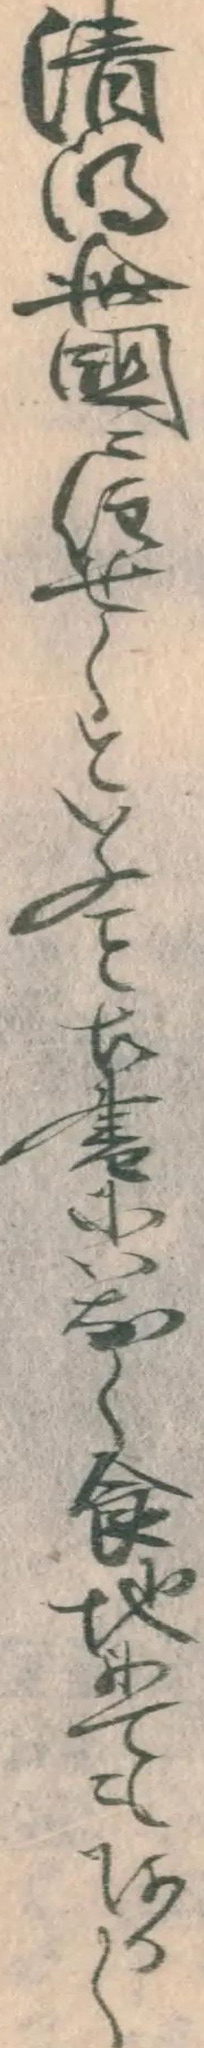晴明此国に住せくといふこと古書にはなく食地にてもありし
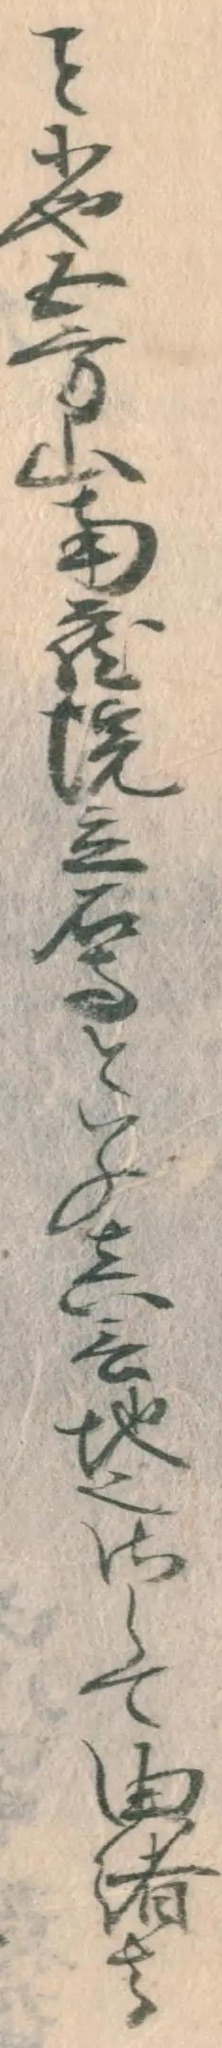ことにや五方山南蔵院立石寺といふ真言地也さして由緒は
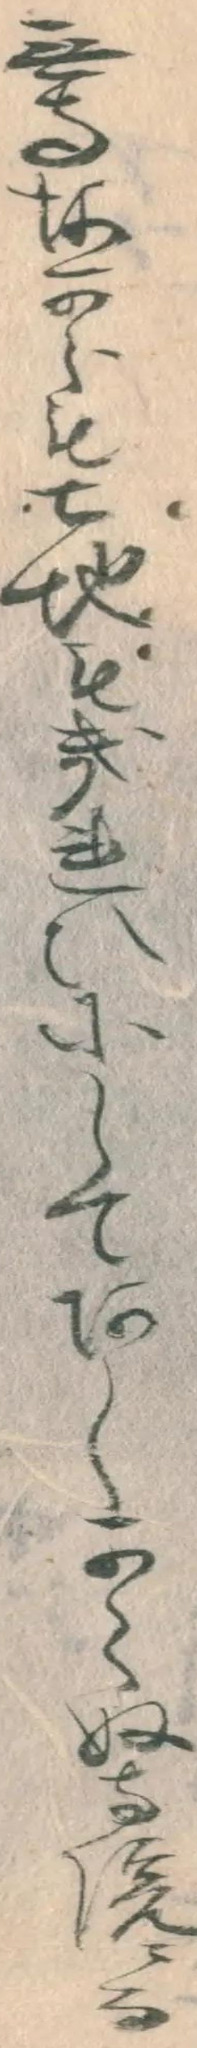無寺なからも土地もきれひにしてあしてからぬ寺院にて
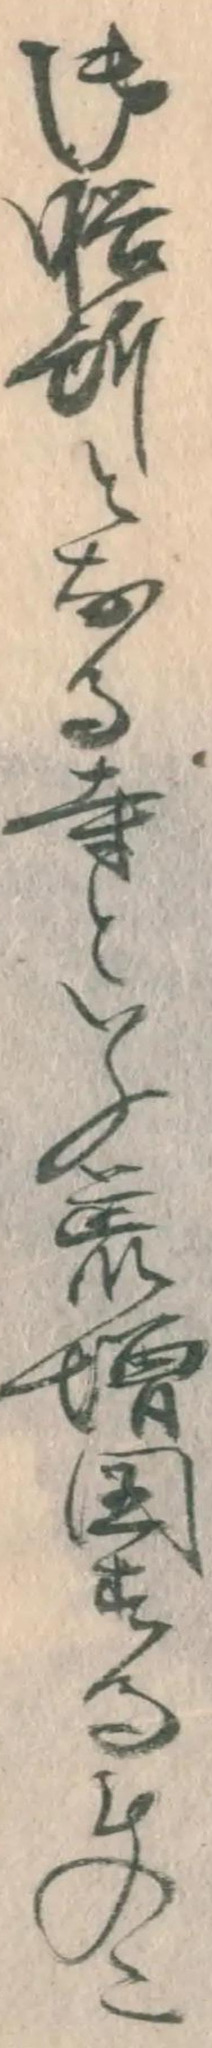御膳所となる寺といふ荒増図するもの也

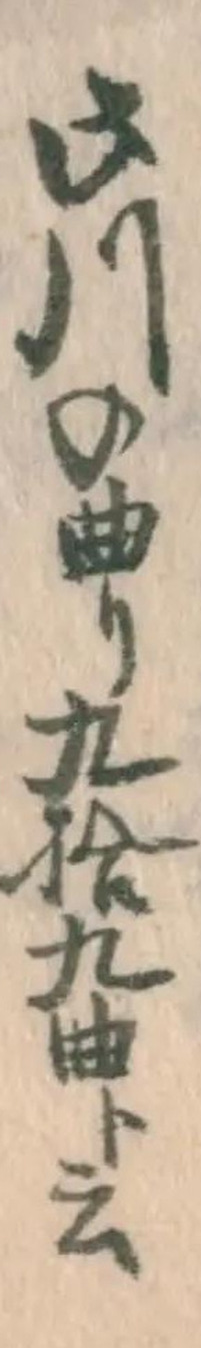此川の曲九拾九曲と云
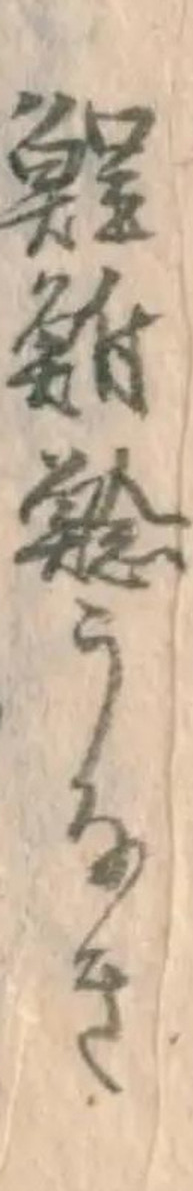鯉鮒鯰うなき
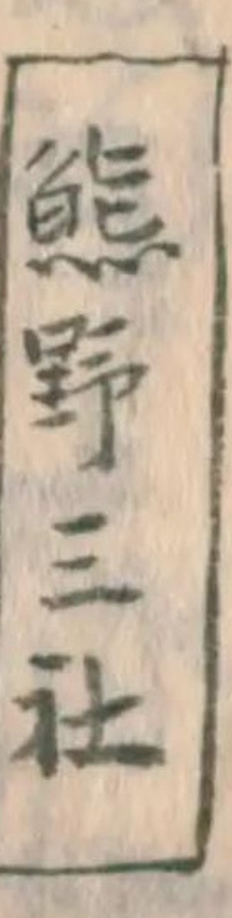熊野三社
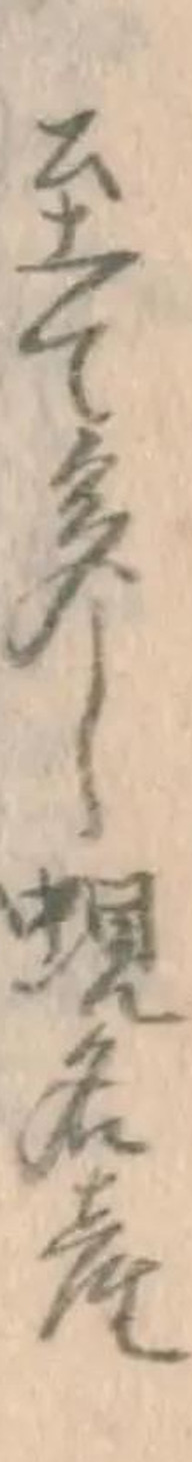至て多し蜆名産
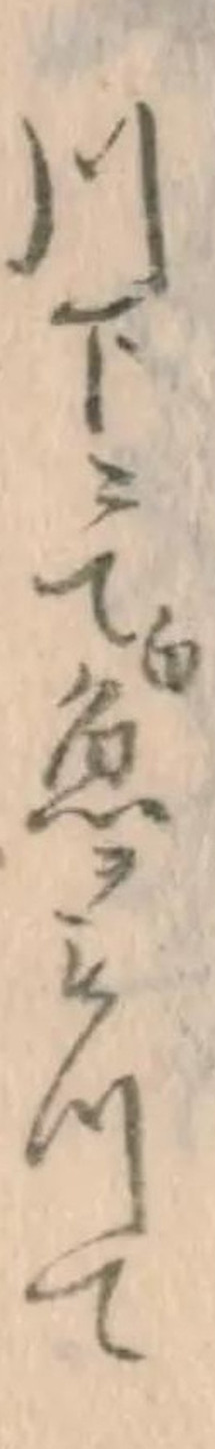川下にて白魚をもつて
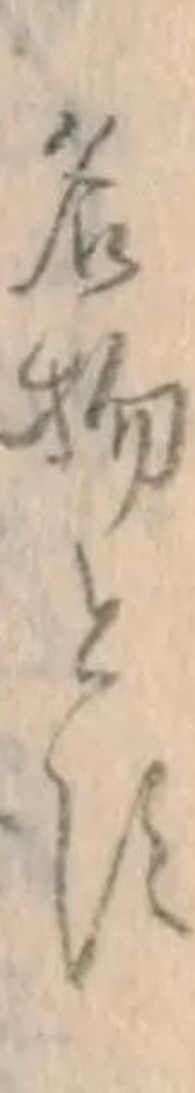名物とす
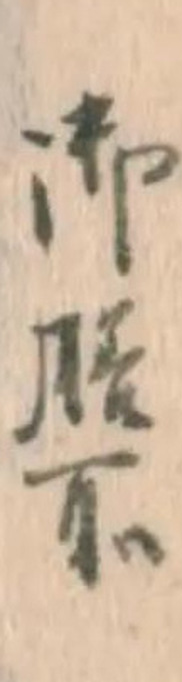御膳所
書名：四神地名録 6巻. [4]葛飾郡
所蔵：国立国会図書館 National Diet Library, JAPAN
